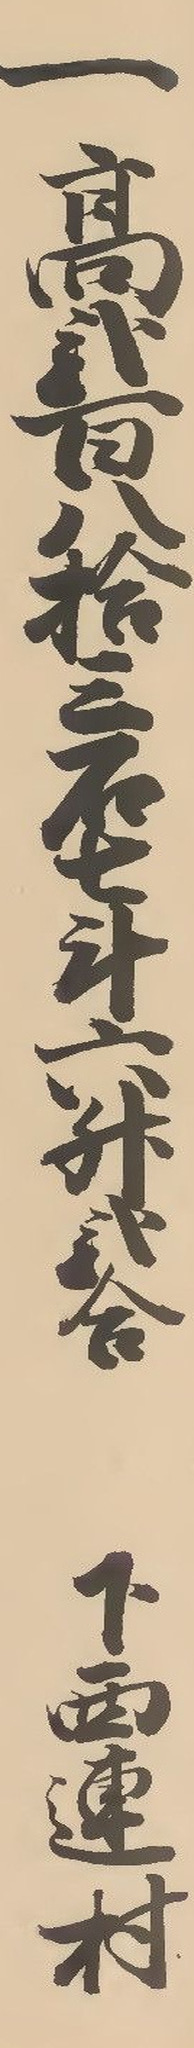一高弐百八拾三石七斗六升弐合下西連村
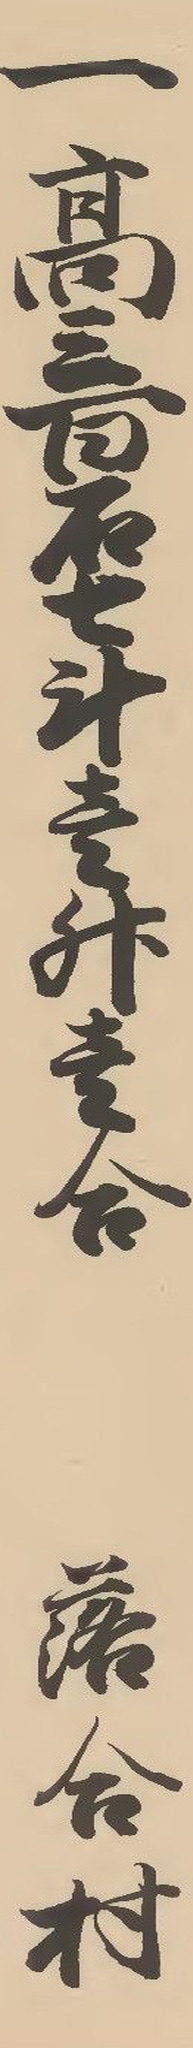一高三百石七斗壱升壱合落合村
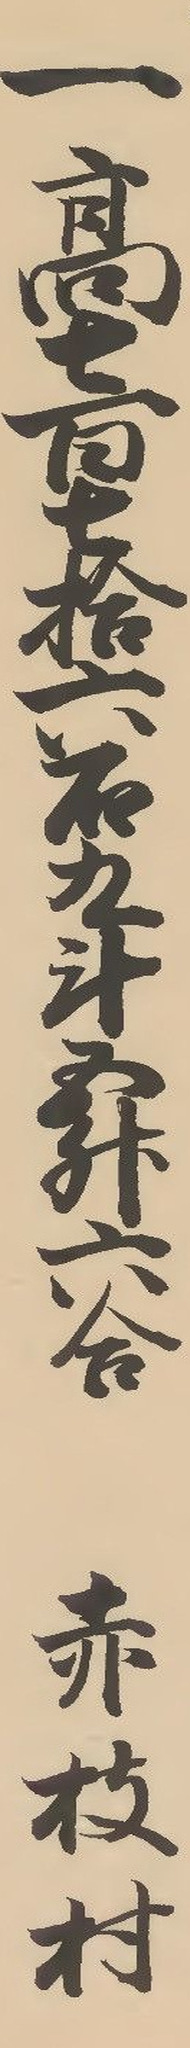一高七百七拾六石九斗五升六合赤枝村
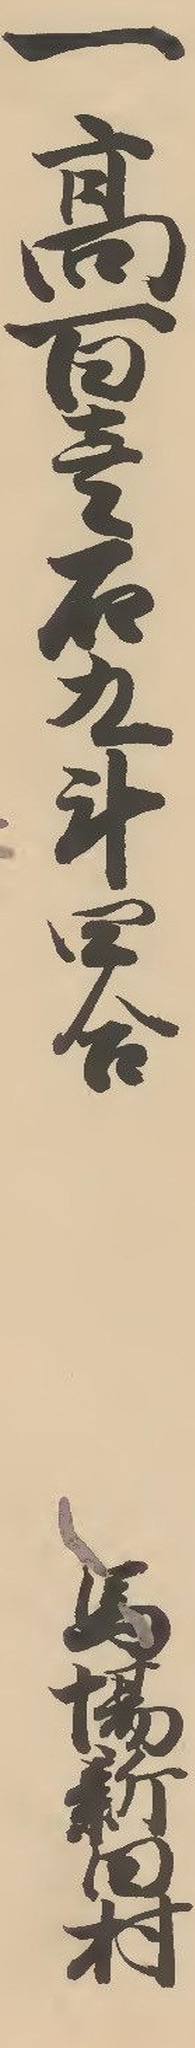一高百壱石九斗四合馬場新田村

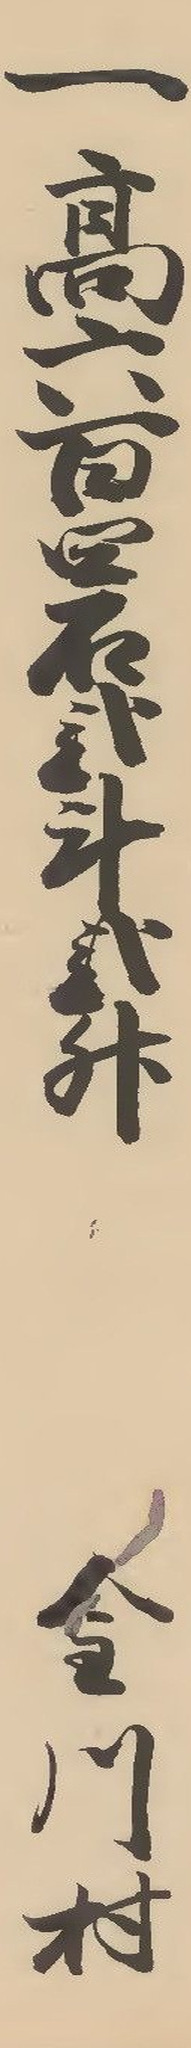一高六百四石弐斗弐升金川村
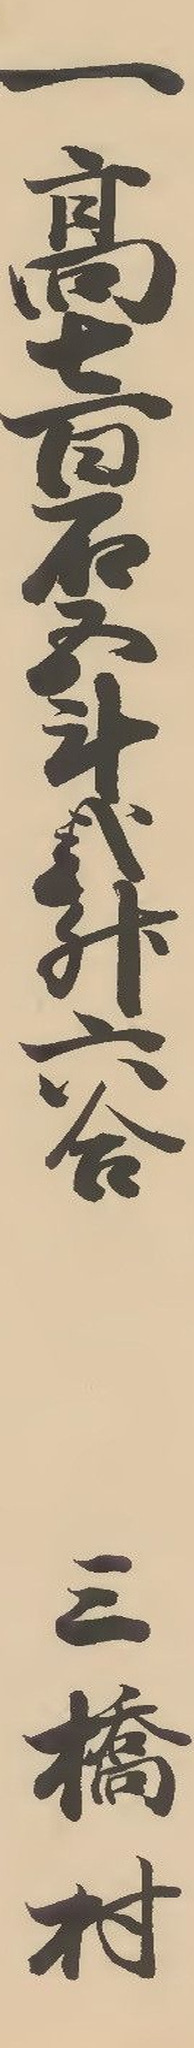一高七百石五斗弐升六合三橋村
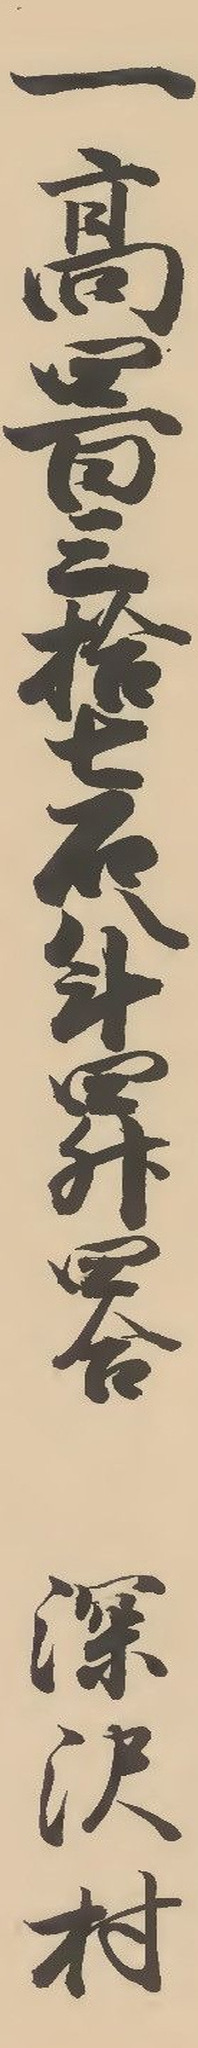一高四百三拾七石八斗四升四合深沢村
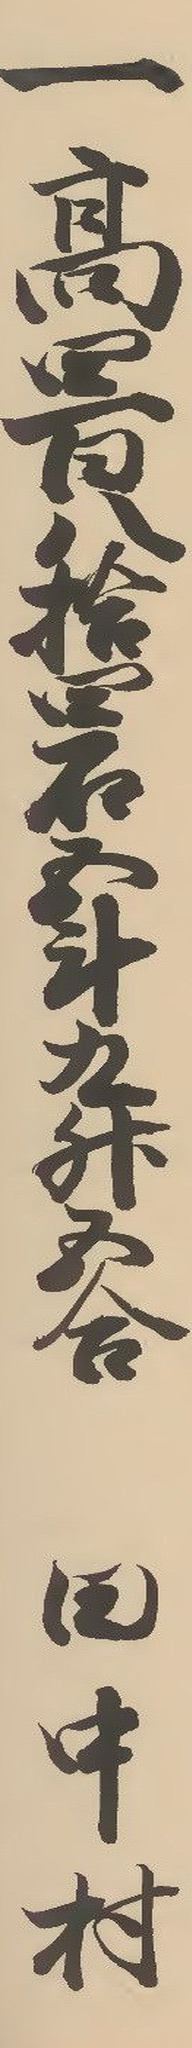一高四百八拾四石五斗九升五合田中村
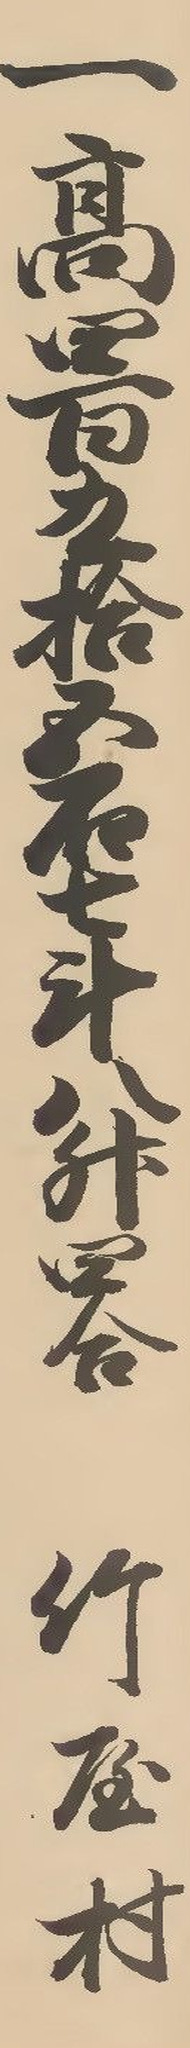一高四百九拾五石七斗八升四合竹屋村
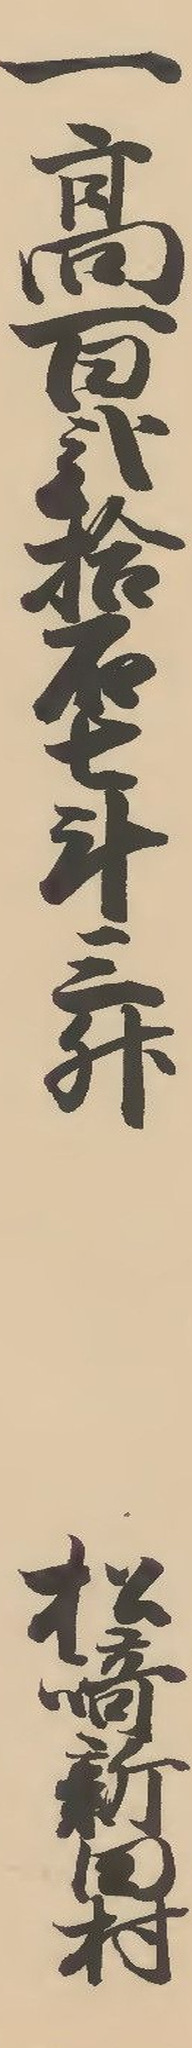一高百弐拾石七斗三升松崎新田村
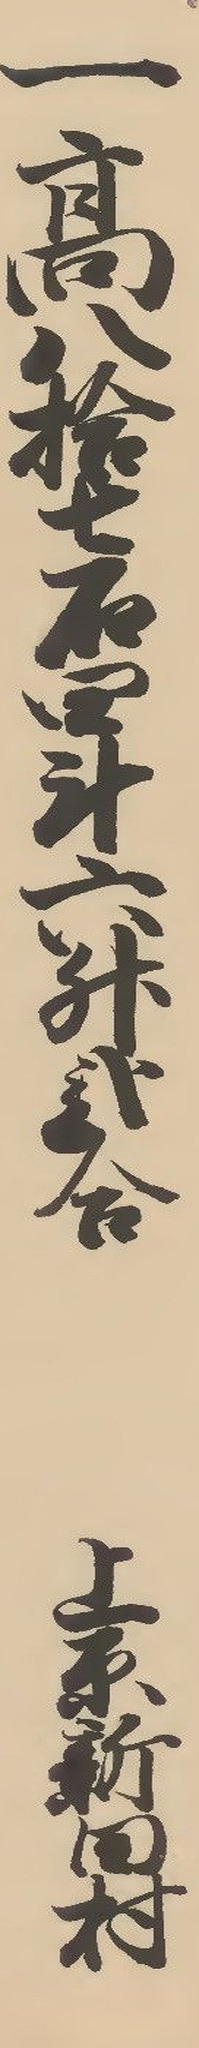一高八拾七石四斗六升弐合上原新田村
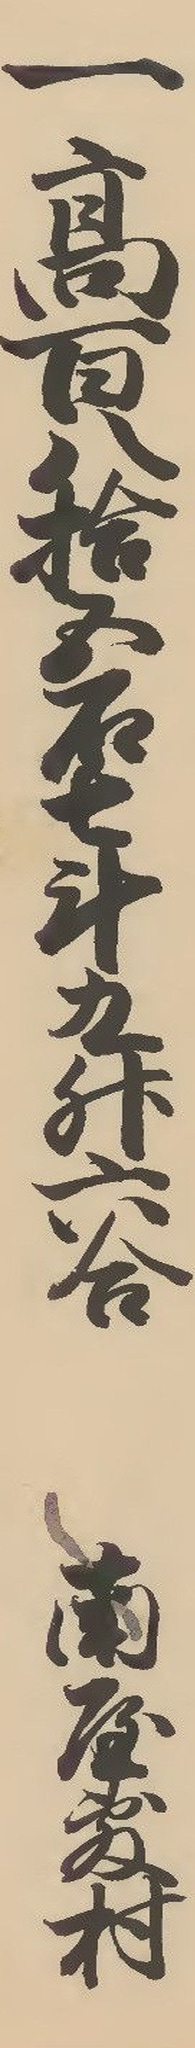一高百八拾五石七斗九升六合南屋敷村

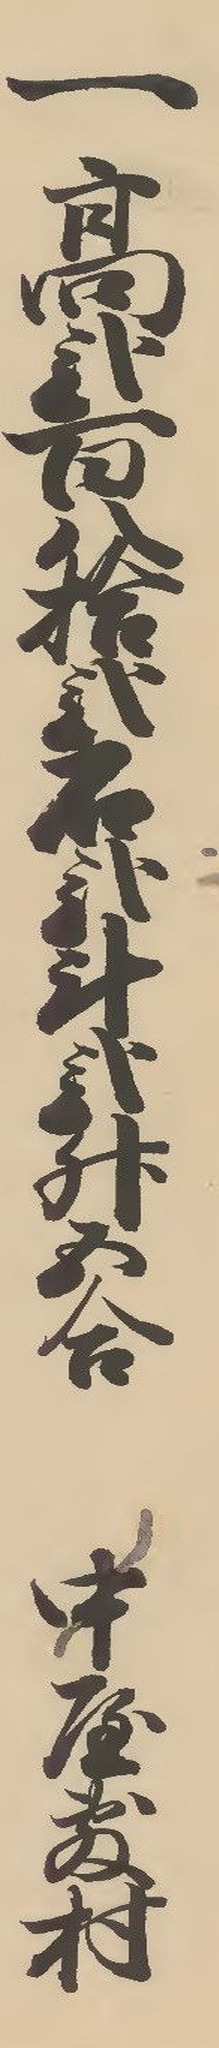一高弐百八拾弐石弐斗弐升五合中屋敷村
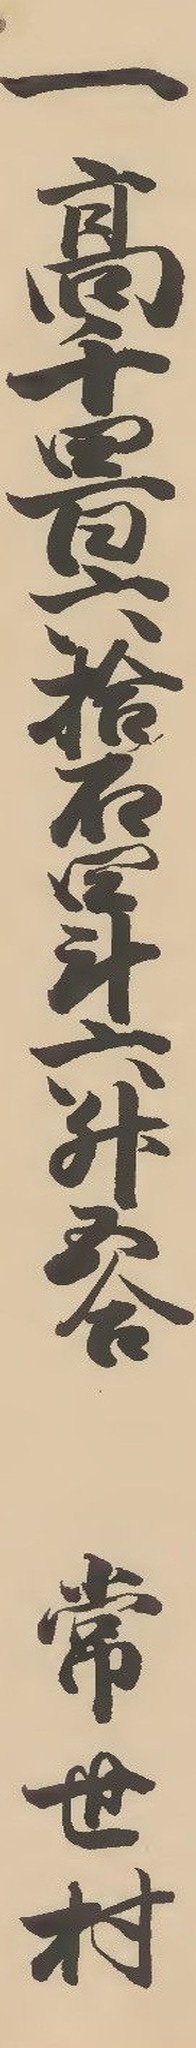一高千四百六拾石四斗六升五合常世村
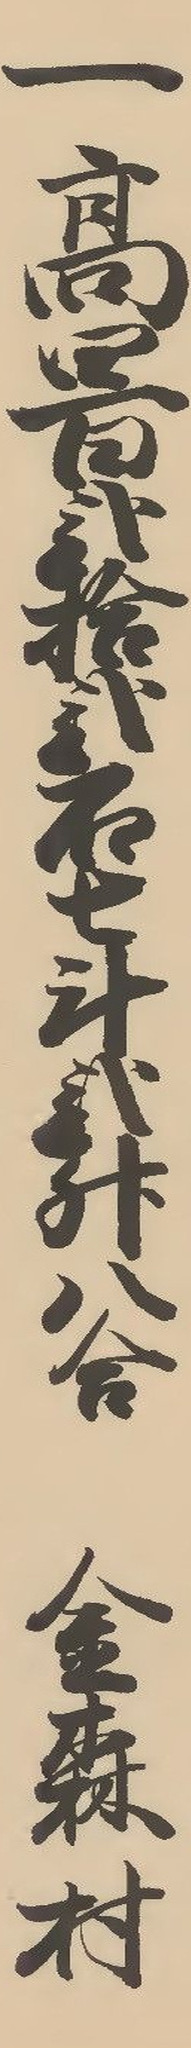一高四百弐拾弐石七斗弐升八合金森村
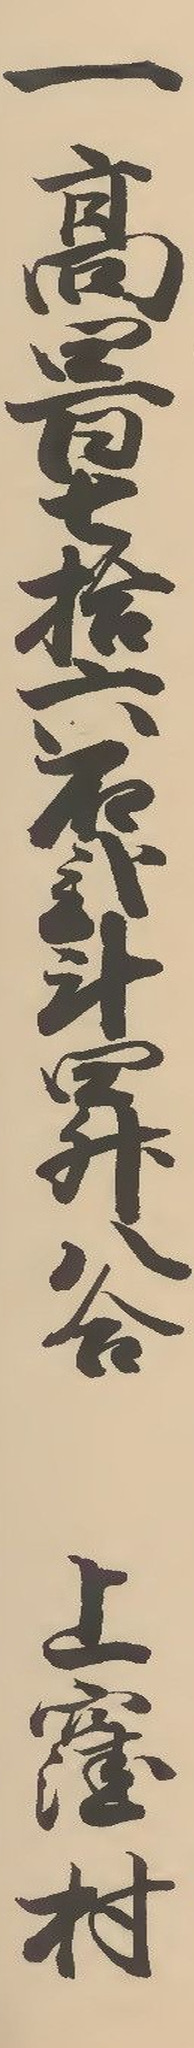一高四百七拾六石弐斗四升八合上窪村
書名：陸奥国郷帳　１
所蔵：国立公文書館 National Archives of Japan
